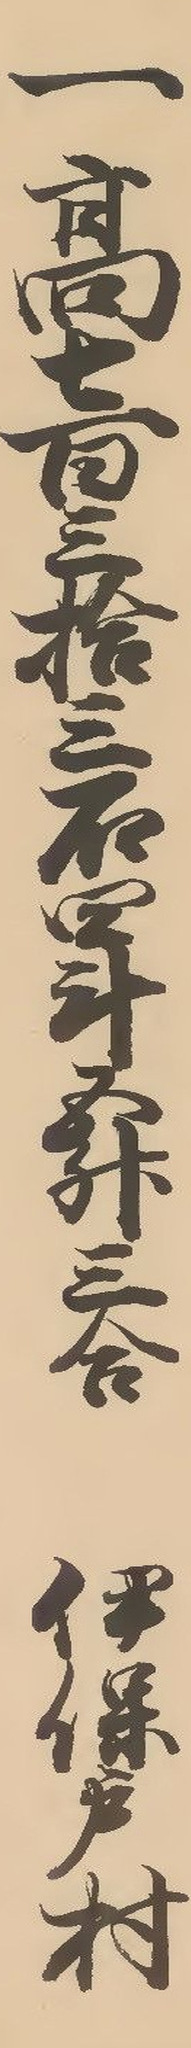一髙七百三拾三石四斗五升三合伊保戸村
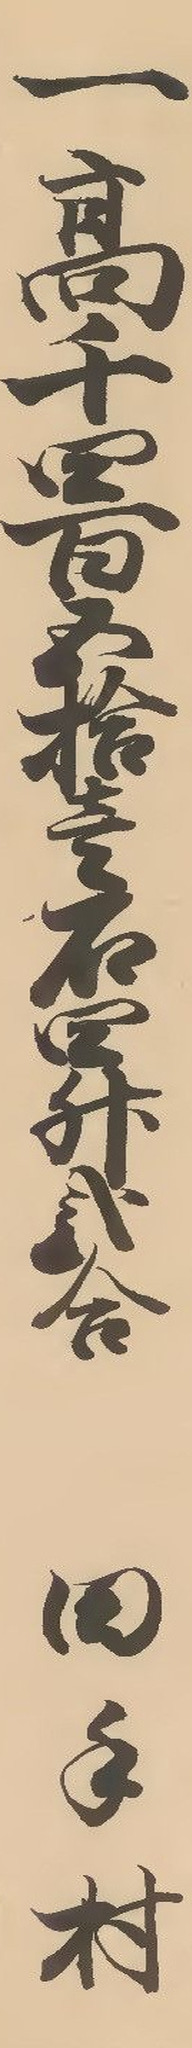一髙千四百五拾壱石四升弐合田手村
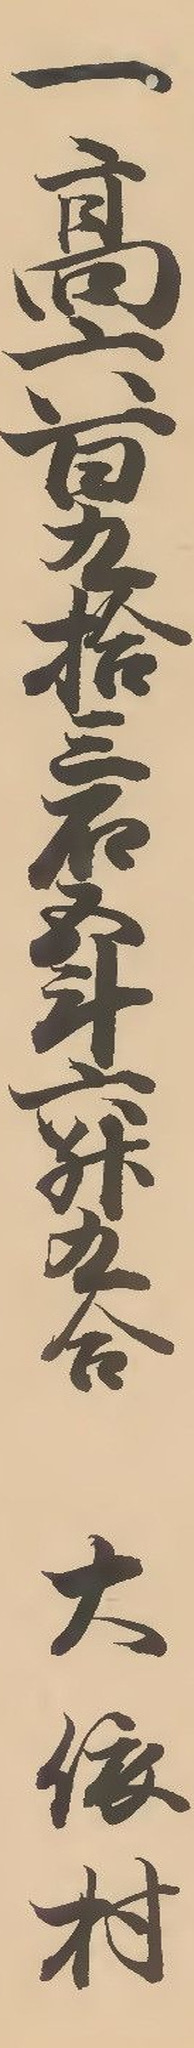一髙六百九拾三石五斗六升九合大依村
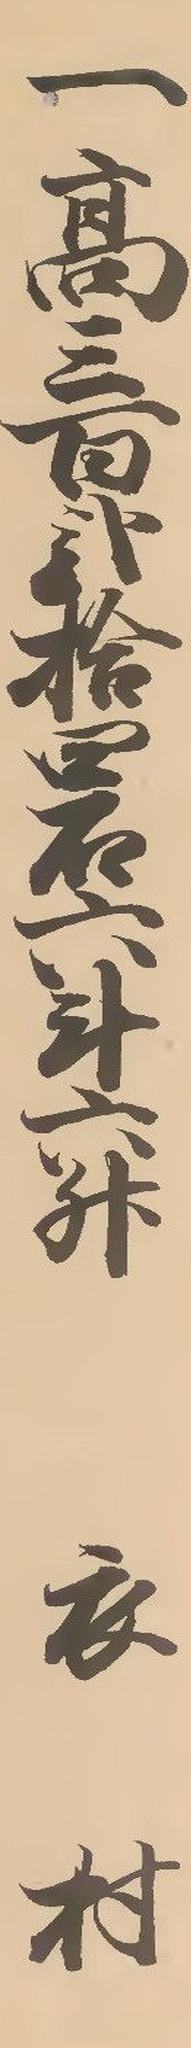一髙三百弐拾四石六斗六升衣村
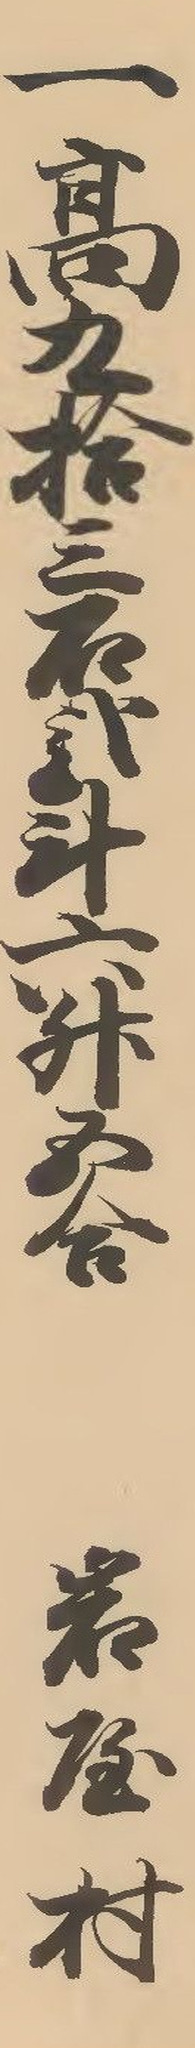一髙九拾三石弐斗六升五合岩屋村
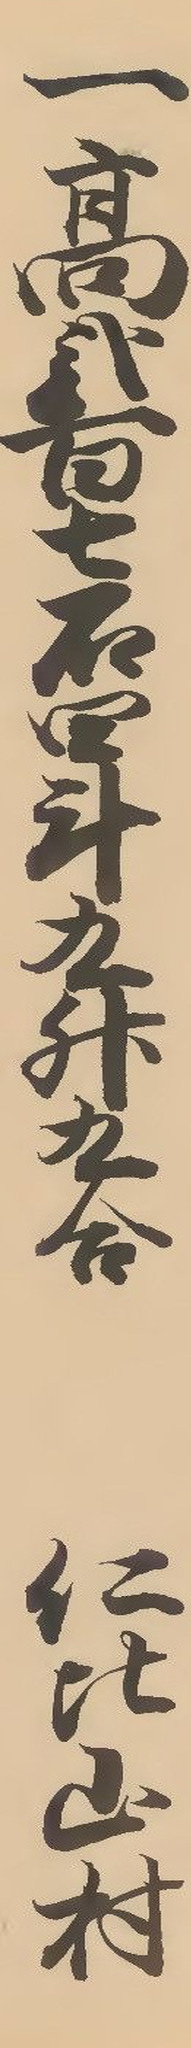一髙弐百七石四斗九升九合仁比山村
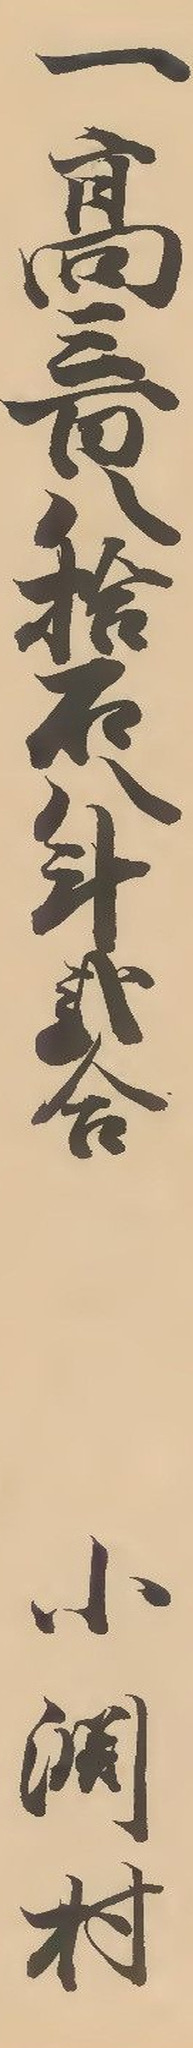一髙三百八拾石八斗弐合小淵村

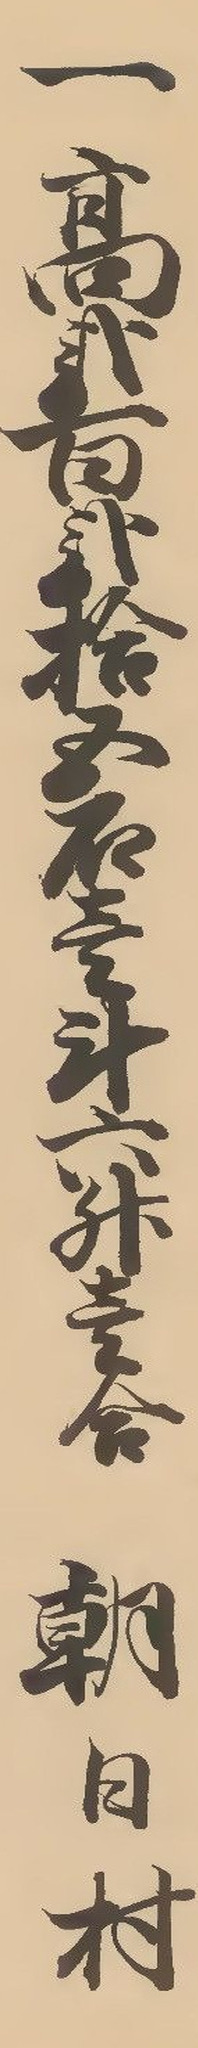一髙弐百弐拾五石壱斗六升壱合朝日村
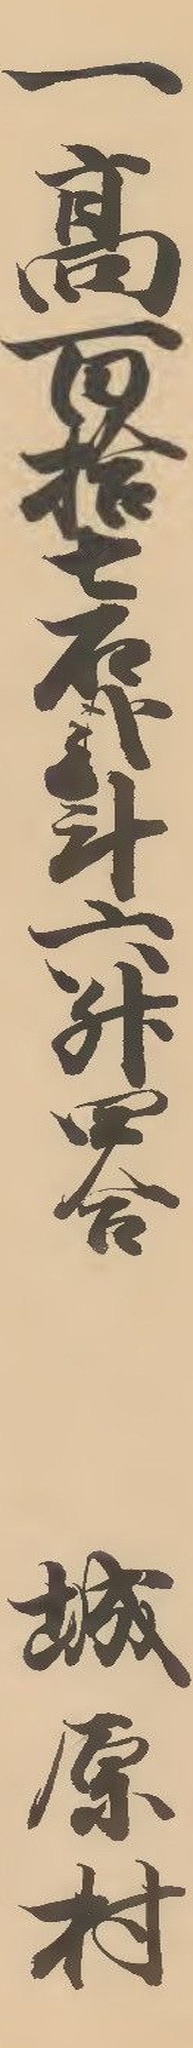一髙百拾七石壱斗六升四合城原村
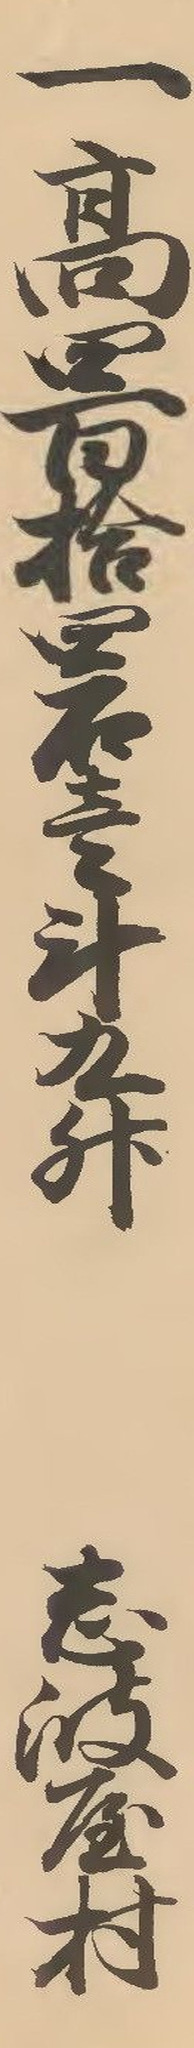一髙四百拾四石壱斗九升志波屋村
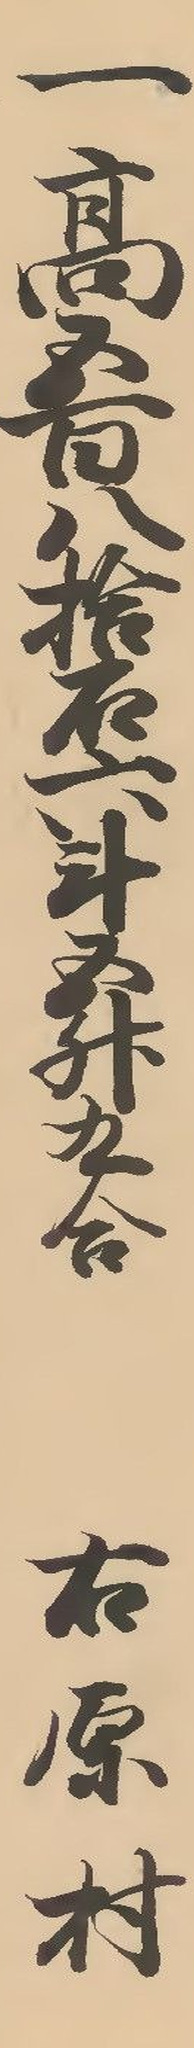一髙五百八拾石六斗五升九合右原村
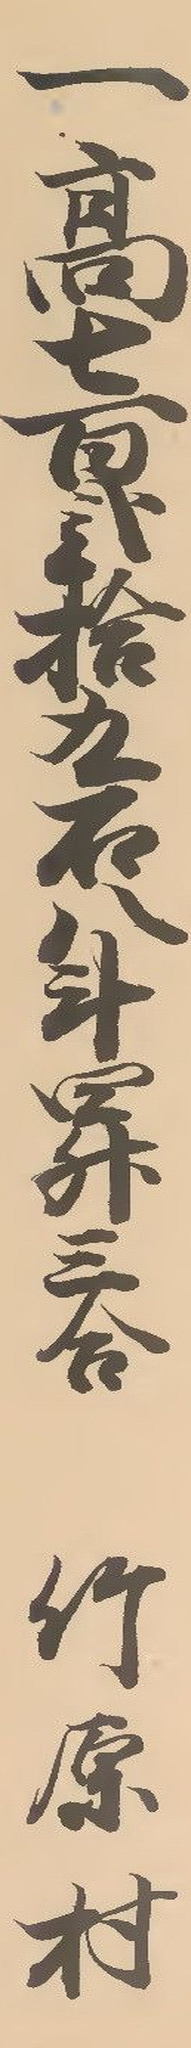一髙七百弐拾九石八斗四升三合竹原村
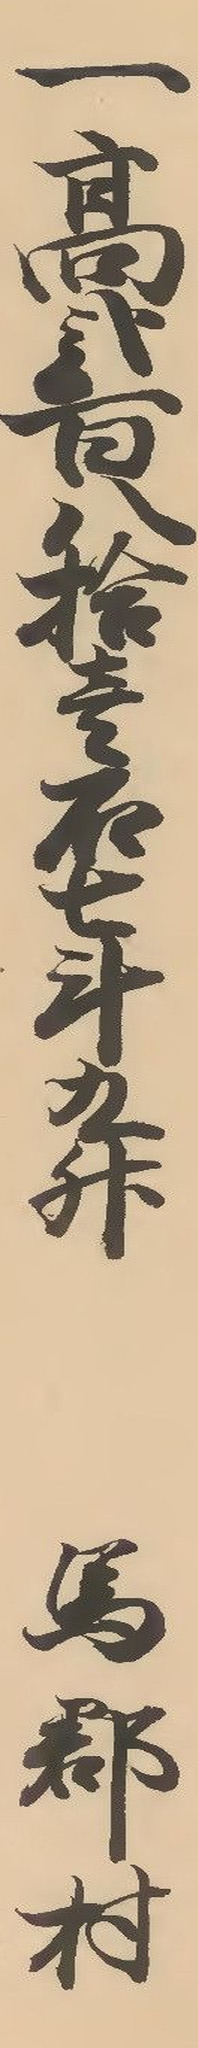一髙弐百八拾壱石七斗九升馬郡村
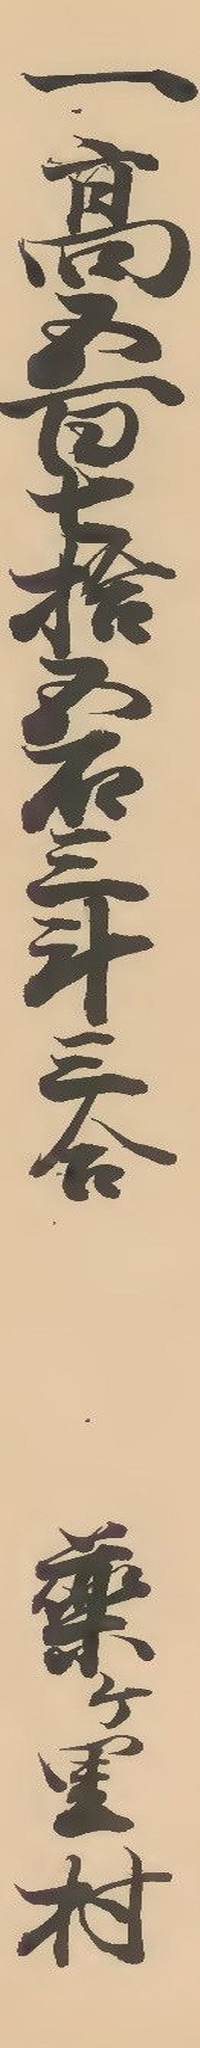一髙五百七拾五石三斗三合ケ里村
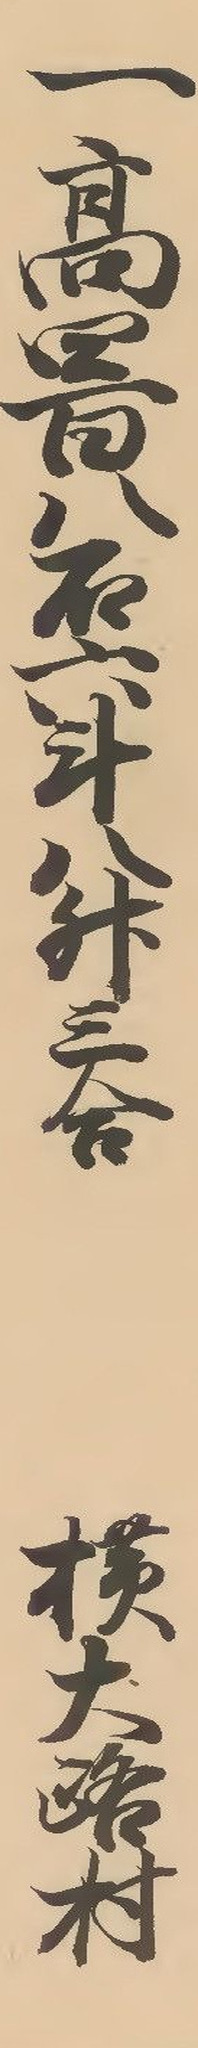一髙四百八石六斗八升三合横大路村

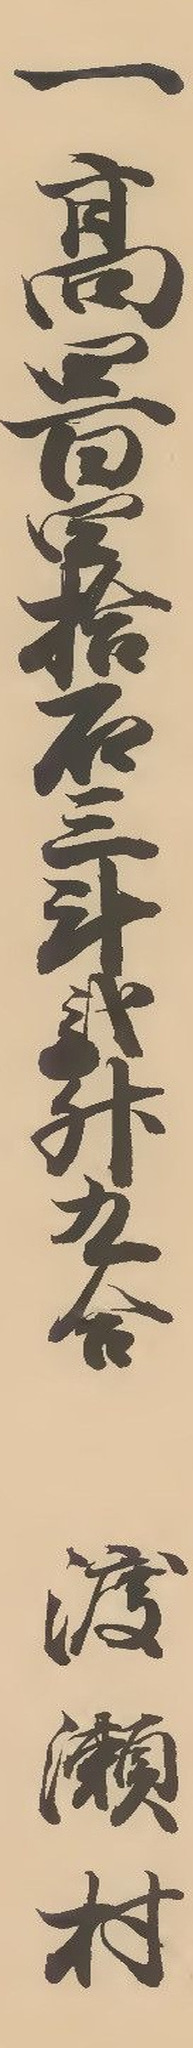一髙四百四拾石三斗弐升九合渡瀬村
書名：肥前国郷帳
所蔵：国立公文書館 National Archives of Japan
